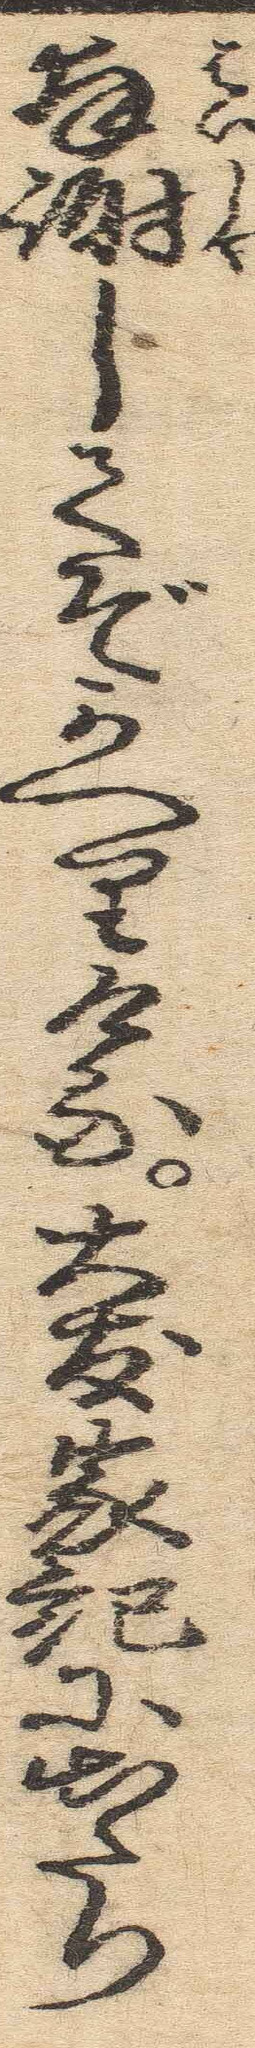拝謝してぞかへりける。大友家記に出たり
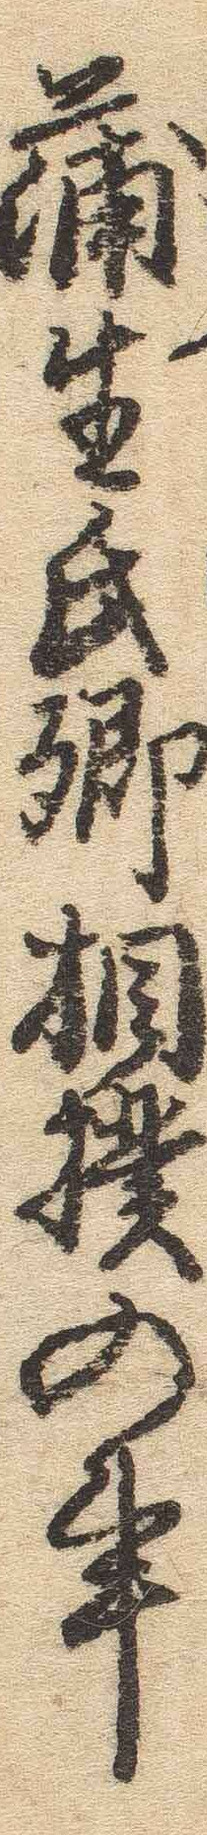蒲生氏郷相撲の事
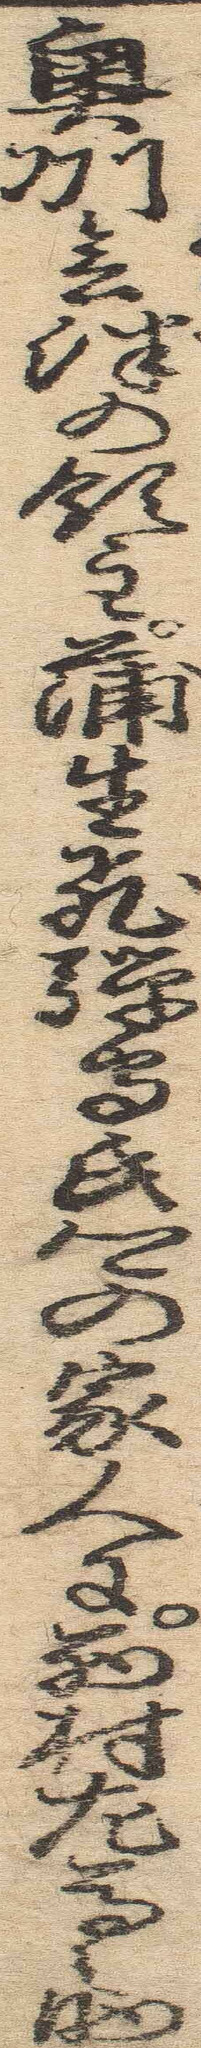奥州会津の領主蒲生飛驒守氏郷の家人に。西村左馬之助
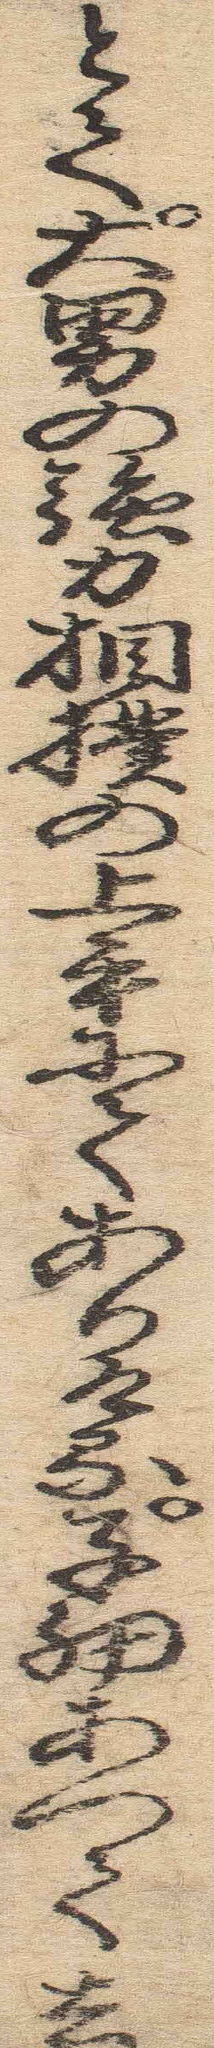とて。大男の強力相撲の上手にてありける。子細あつて去
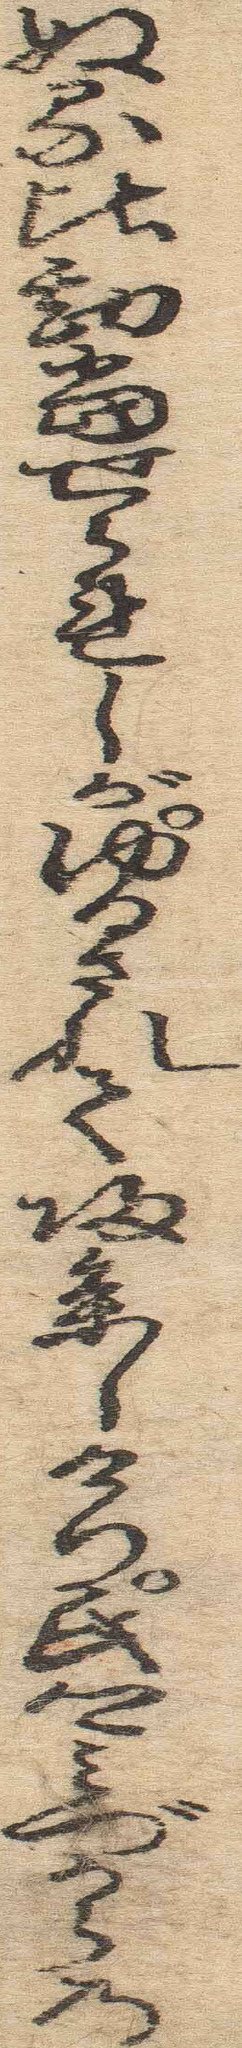ぬる比勘当せられしが。ゆるされて帰参しけり。氏郷みづからの
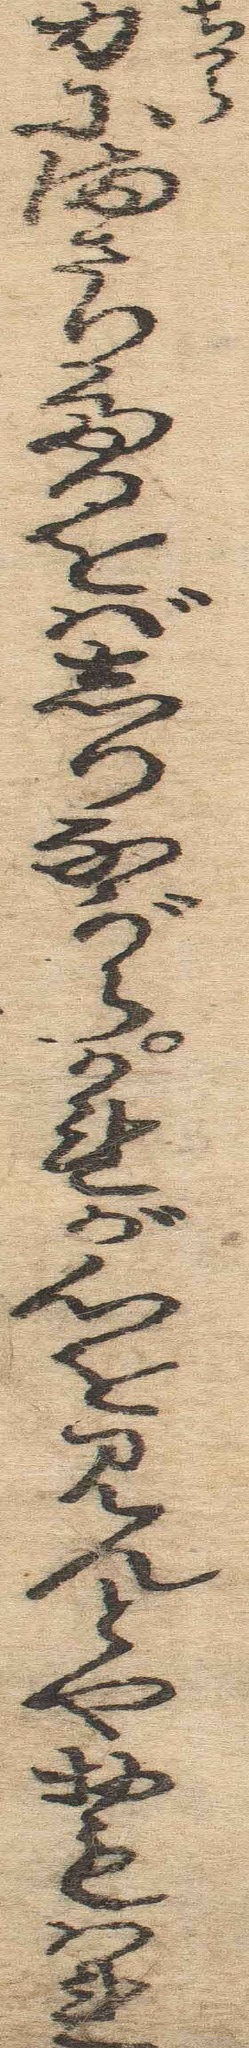力にまさりたるをばしりながら。かれが心を見んとやおもはれ
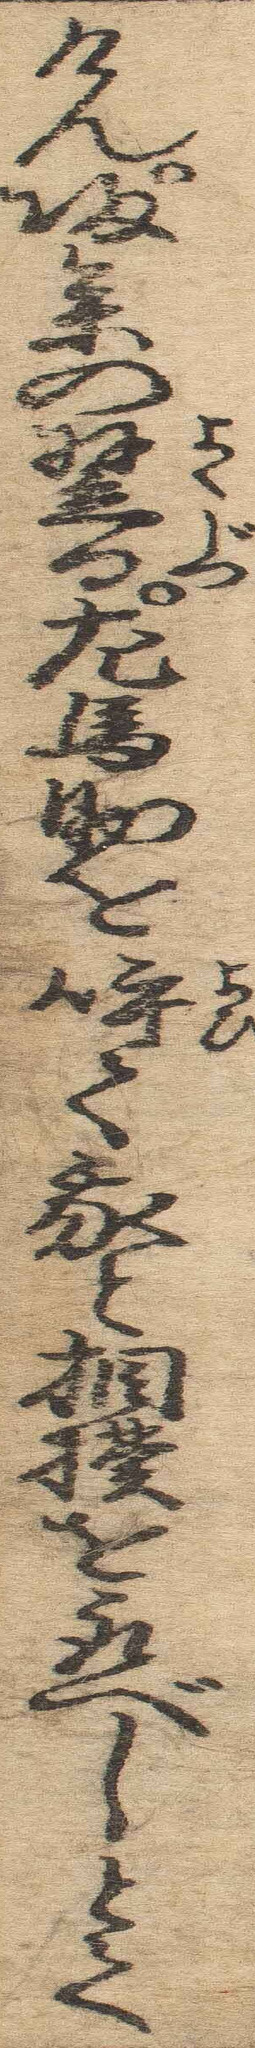けん。帰参の翌日。左馬助を呼て我と相撲を取べしとて

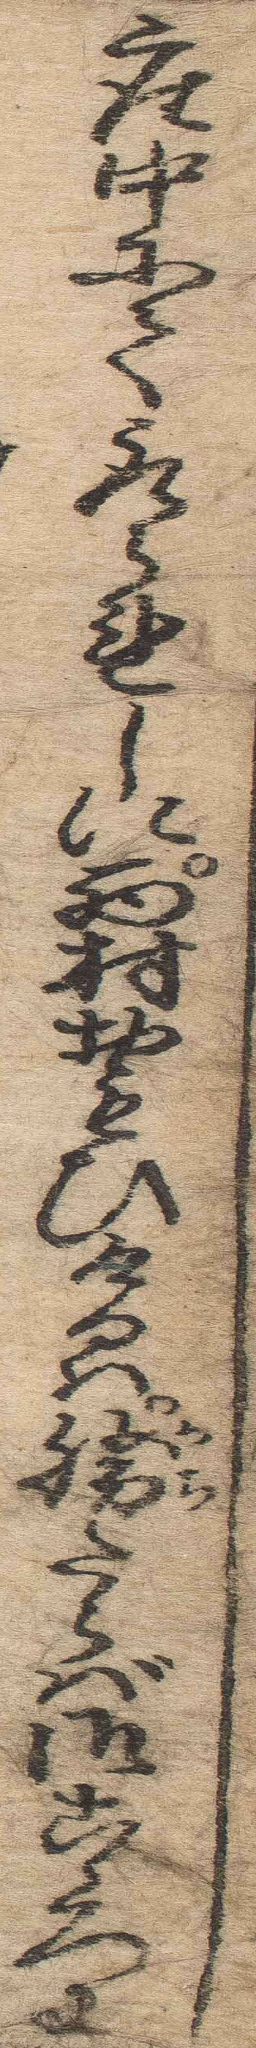座中にて取られしに。西村おもひけるは。勝たらば御こゝろに
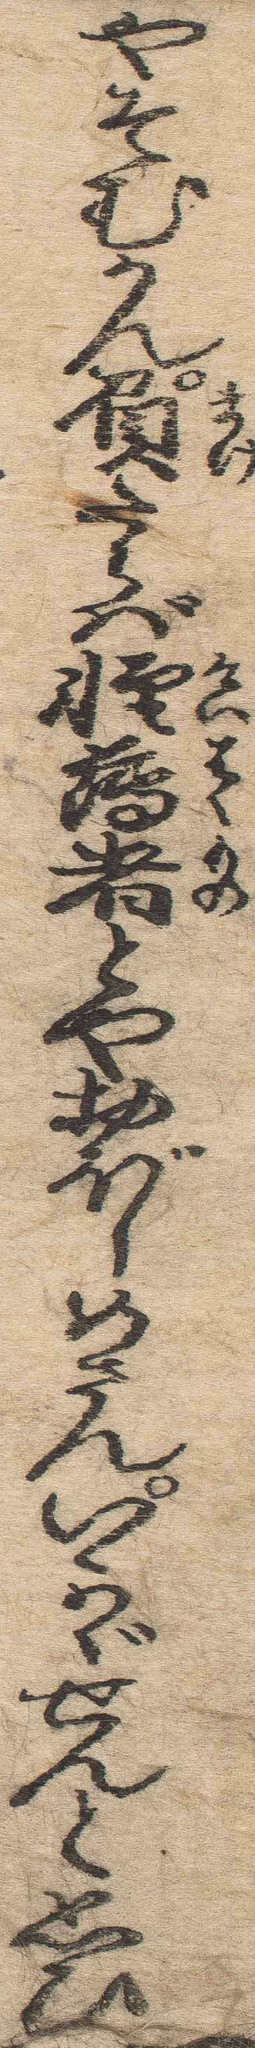やそむかん。負たれば軽薄者とやおぼしめさん。いかゞせんと思ひ
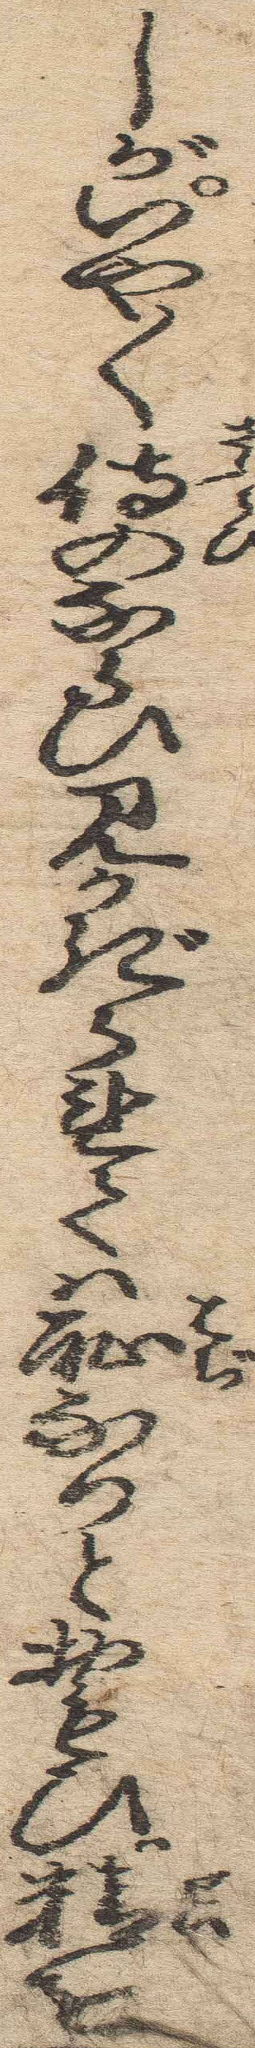しが。いや〳〵侍のならひ見かぎられては恥なりとおもひ精を
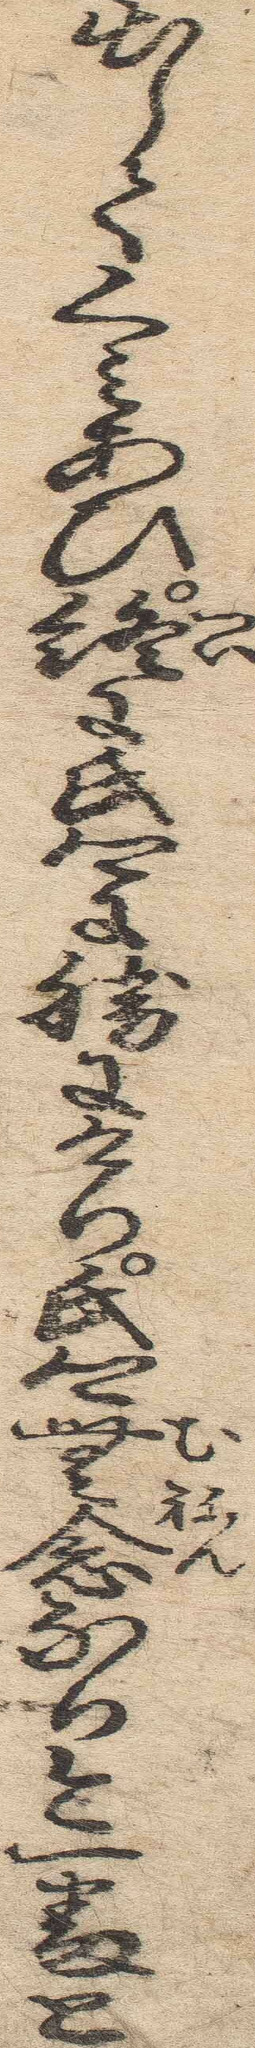出してくみあひ。終に氏郷に勝にけり。氏郷無念なりと一番と
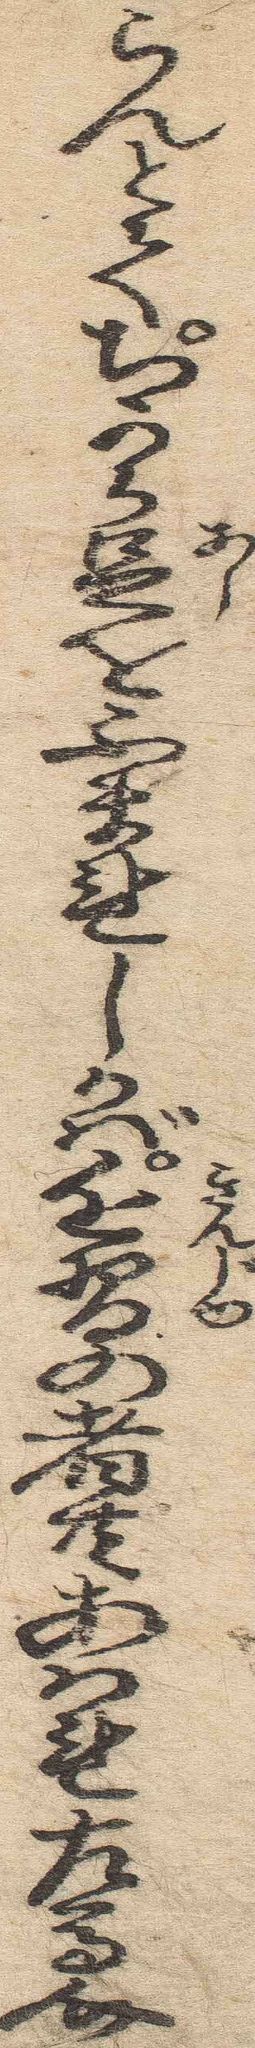らんとて。ちから足をふまれしかば。近習の者共あはれ左馬介
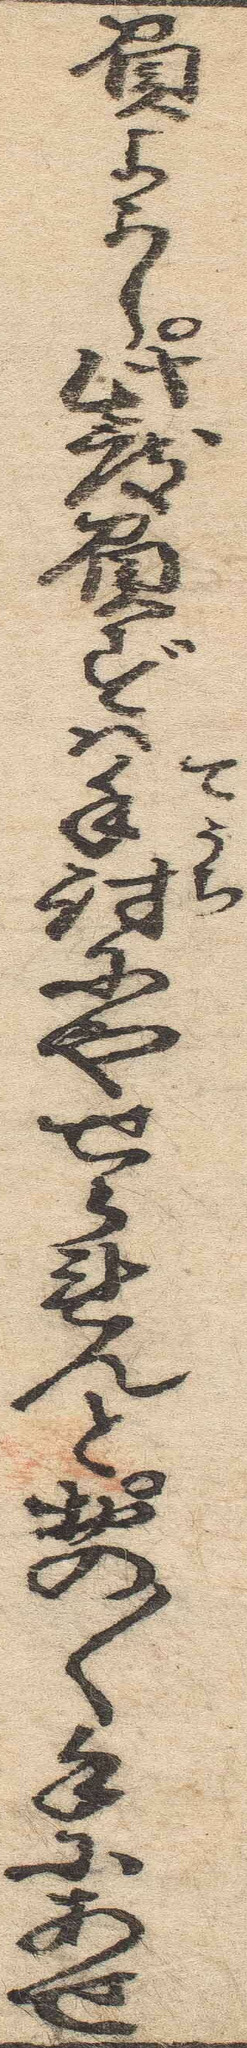負よよし。此度負ずは手討にやせられんと。おの〳〵手にあせ
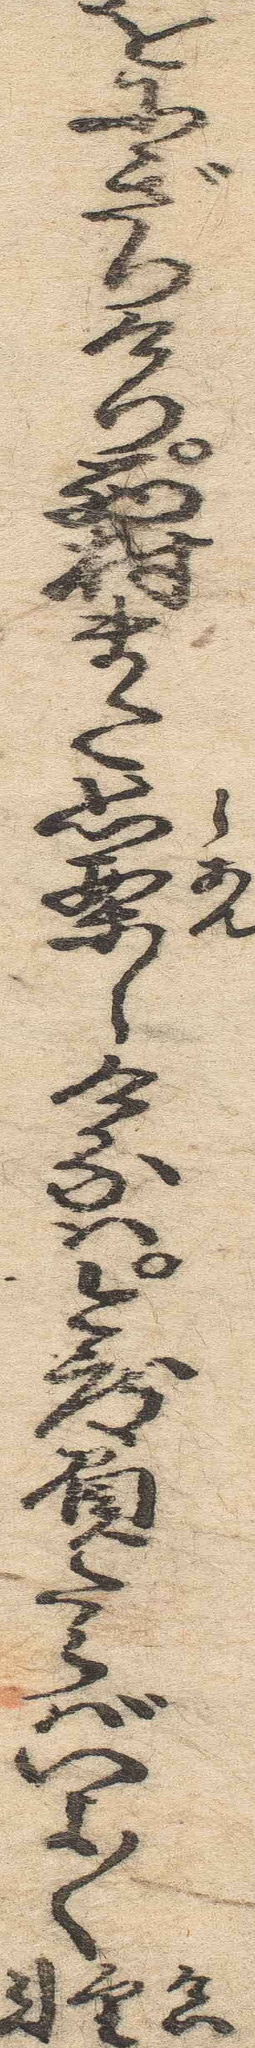をにぎりけり。西村また思案しけるは。今度負たらばいよ〳〵軽
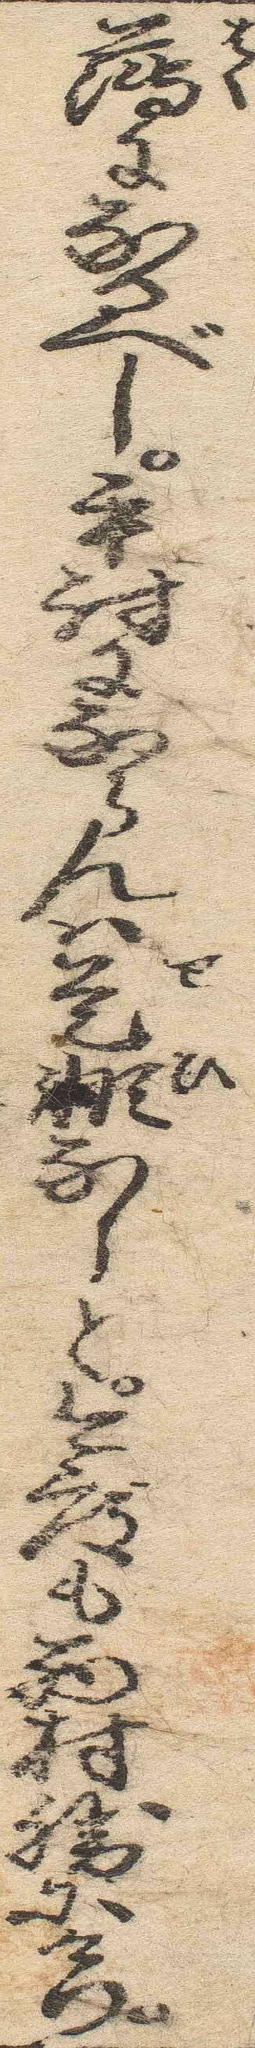薄になるべし。手討にならんは是非なしと今度も西村勝にけり。
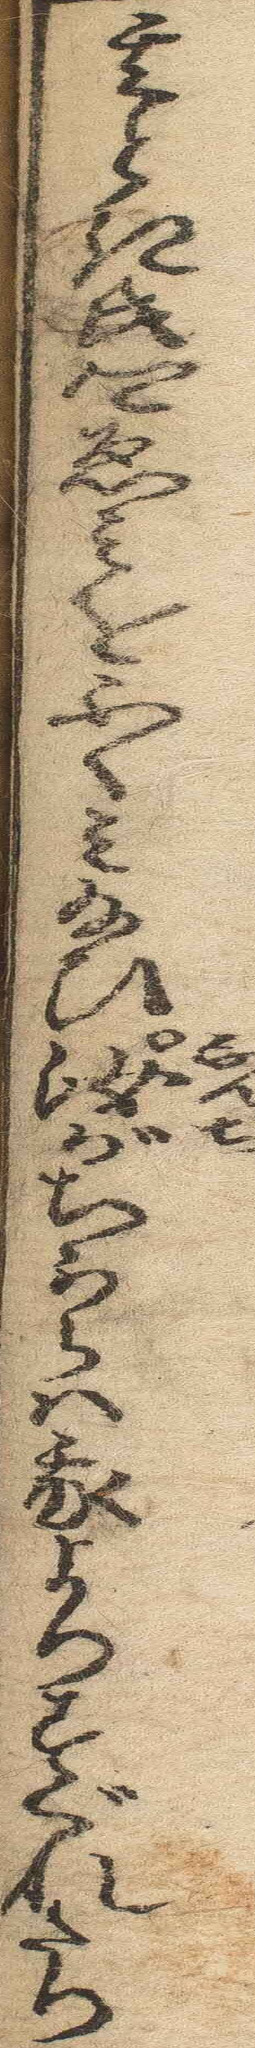其とき氏郷ゑみをふくみ給ひ。汝がちからは我よりすぐれたり
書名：古今相撲大全
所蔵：東京学芸大学附属図書館 国文学研究資料館
